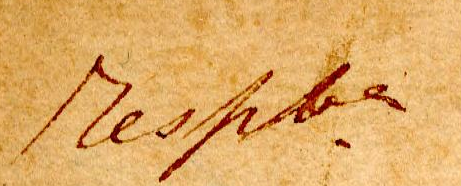respbe.
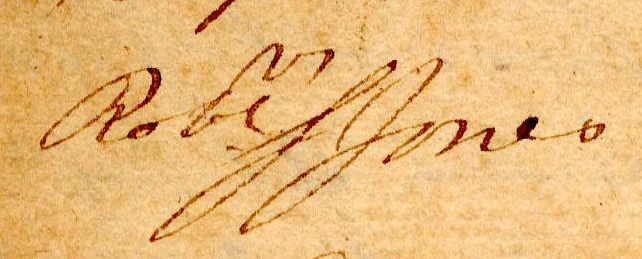Rob^t S Jones
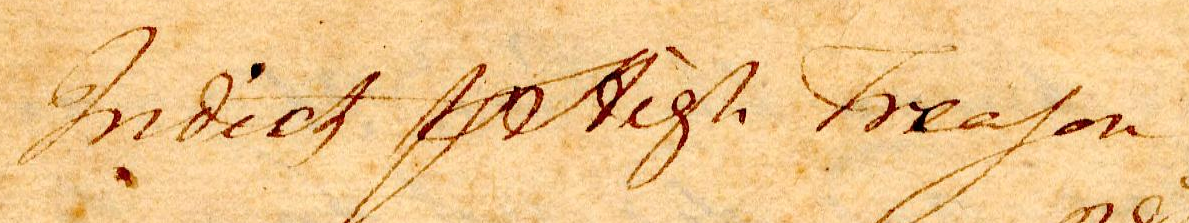Indict for High Treason
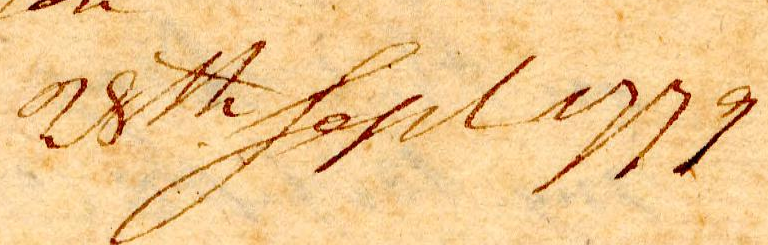28^th Sept 1779
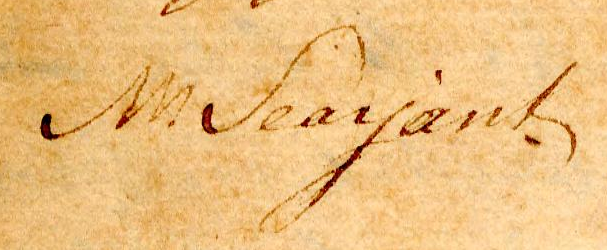M^r Searjant
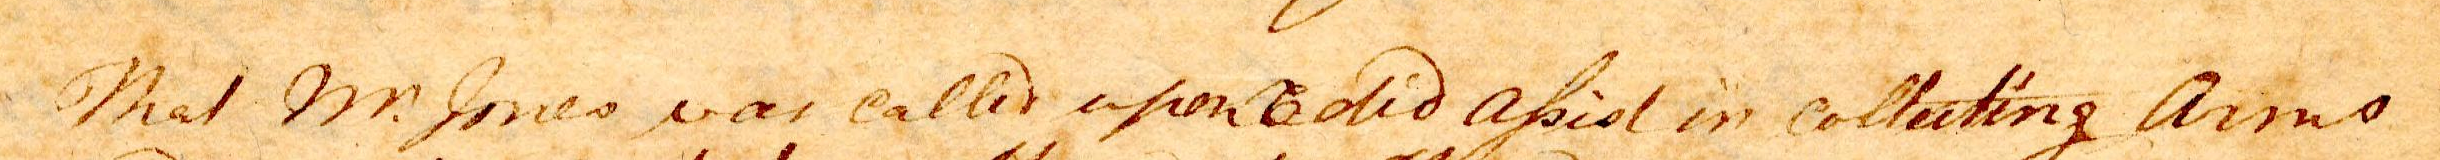That M^r. Jones was called upon & did assist in collecting Arms
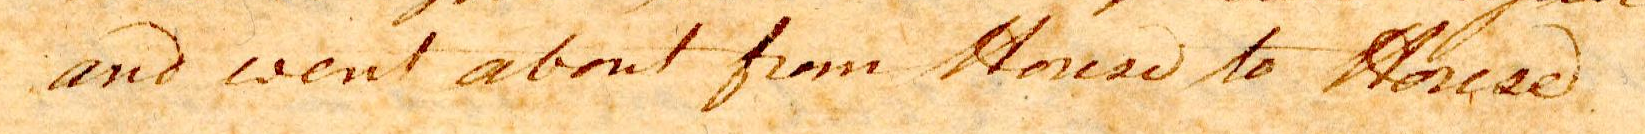and went about from House to House
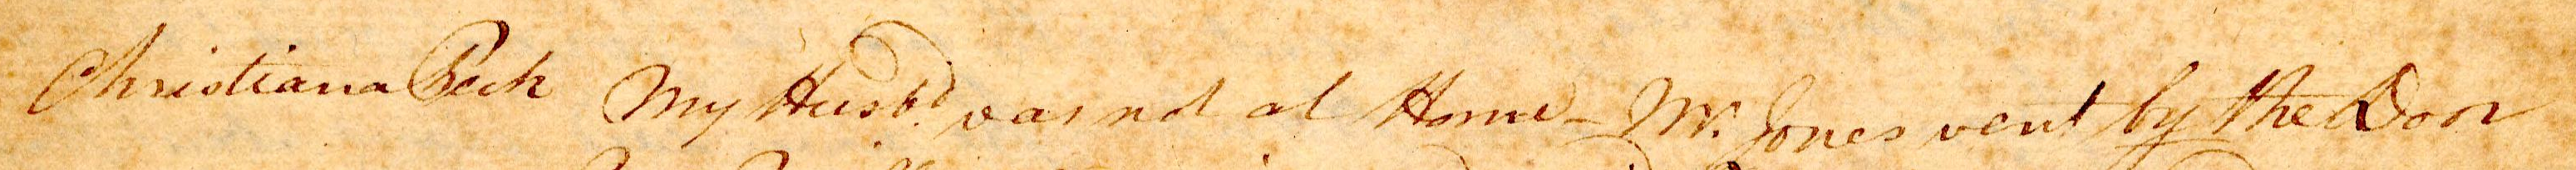Christiana Peck My Husb^d was not at Home- M^r. Jones went by the Door
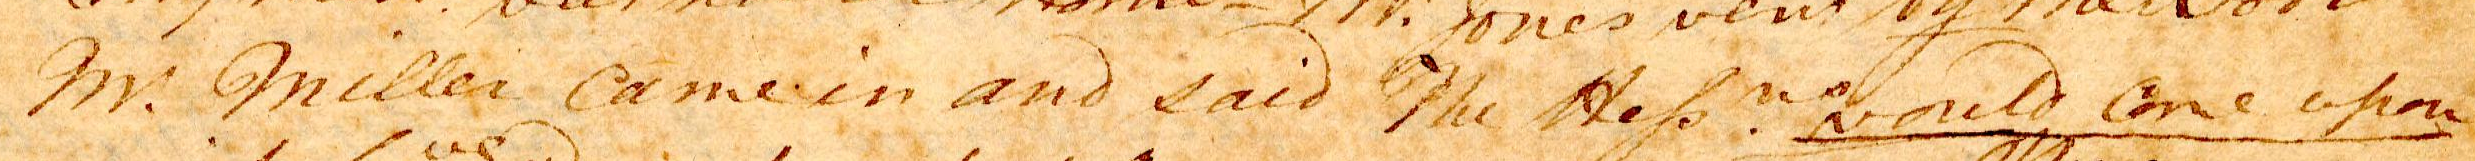M^r. Miller came in and said the Hess^ns. would come upon
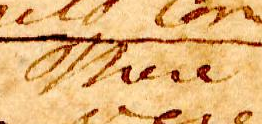There
